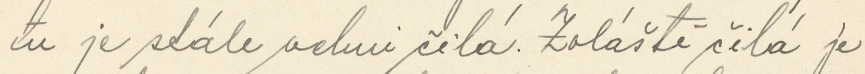tu je stále velmi čilá. Zvláště čilá je
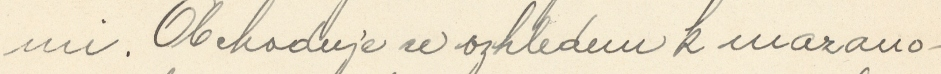mů. Obchoduje se vzhledem k mazano-
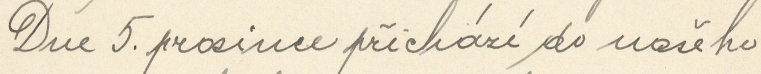Dne 5. prosince přichází do našeho
